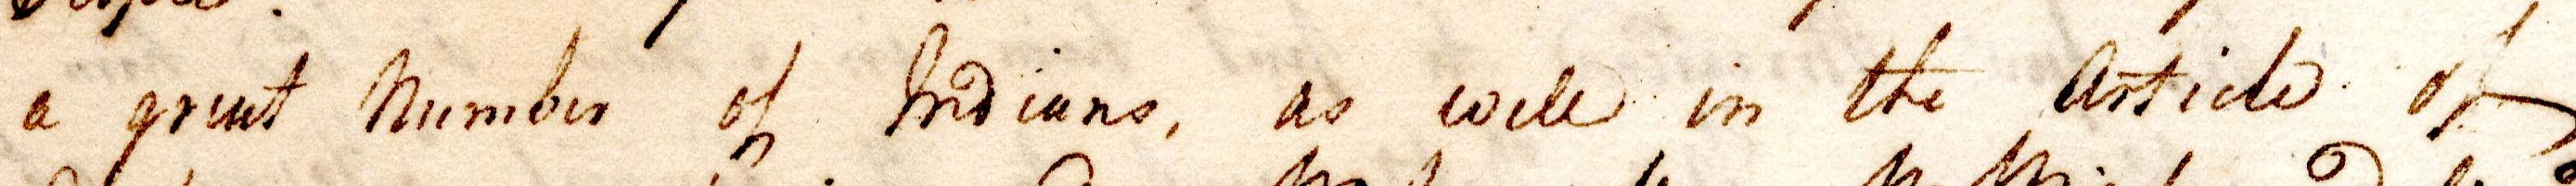a great Number of Indians, as well in the Article of
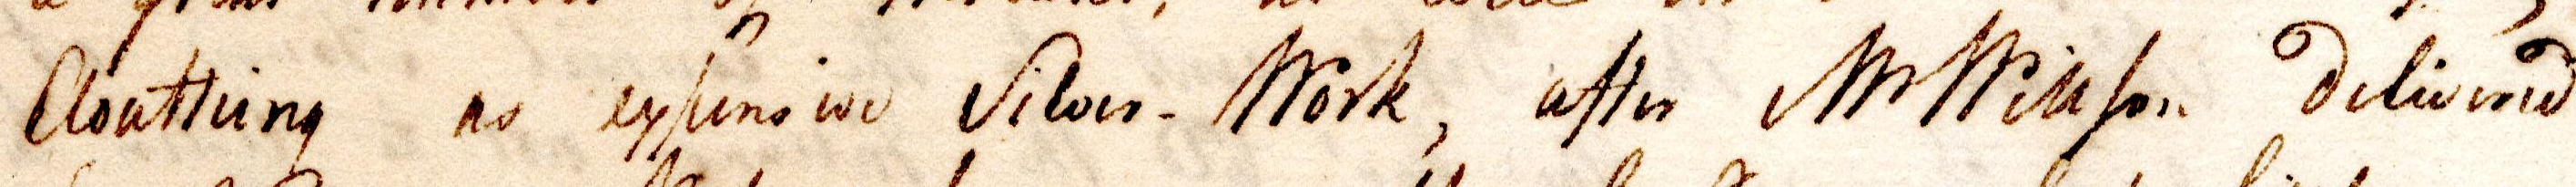Cloathing as expensive Silver-Work, after M^r Willson delivered
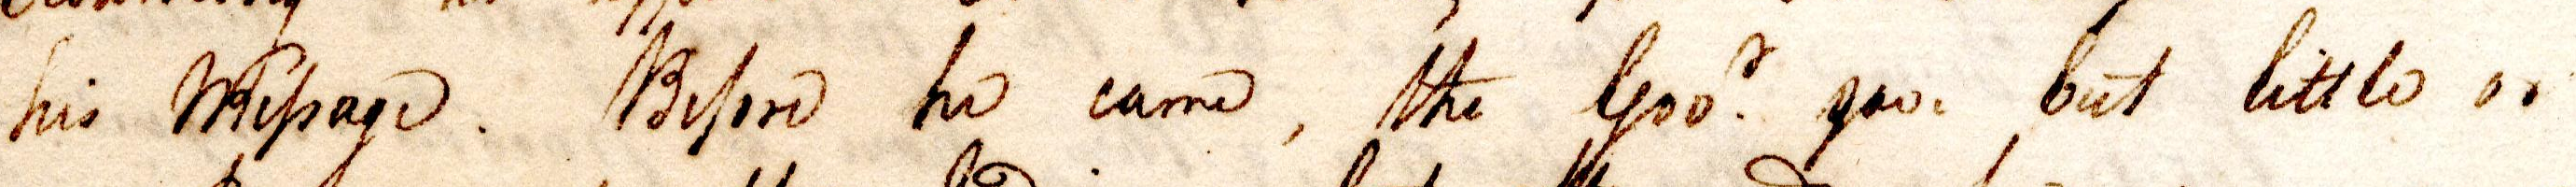his Message. Before he came, the Gov^r. gave but little or
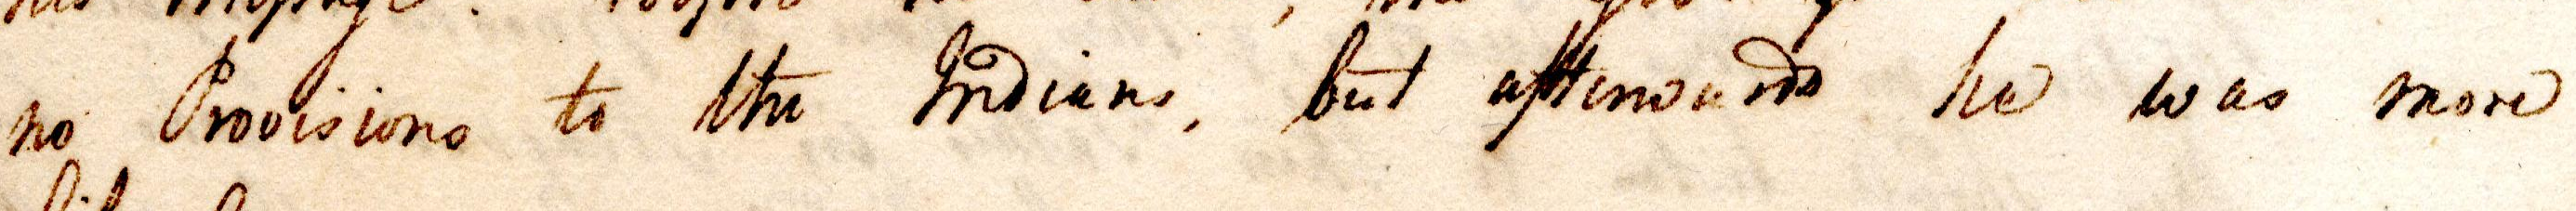no Provisions to the Indians, but afterwards he was more
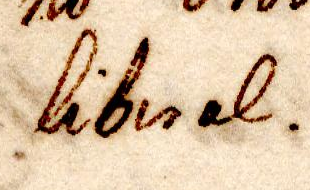liberal.
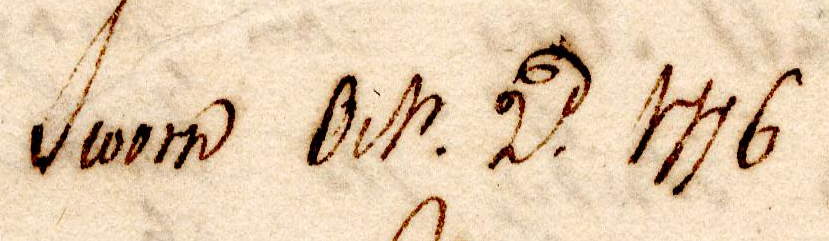Sworn Oct. 2^d. 1776
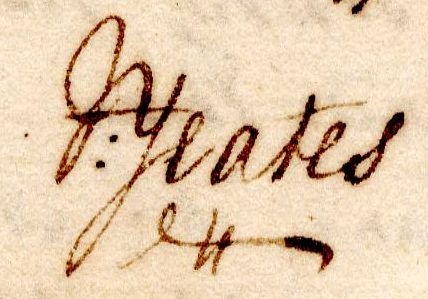J. Yeates
